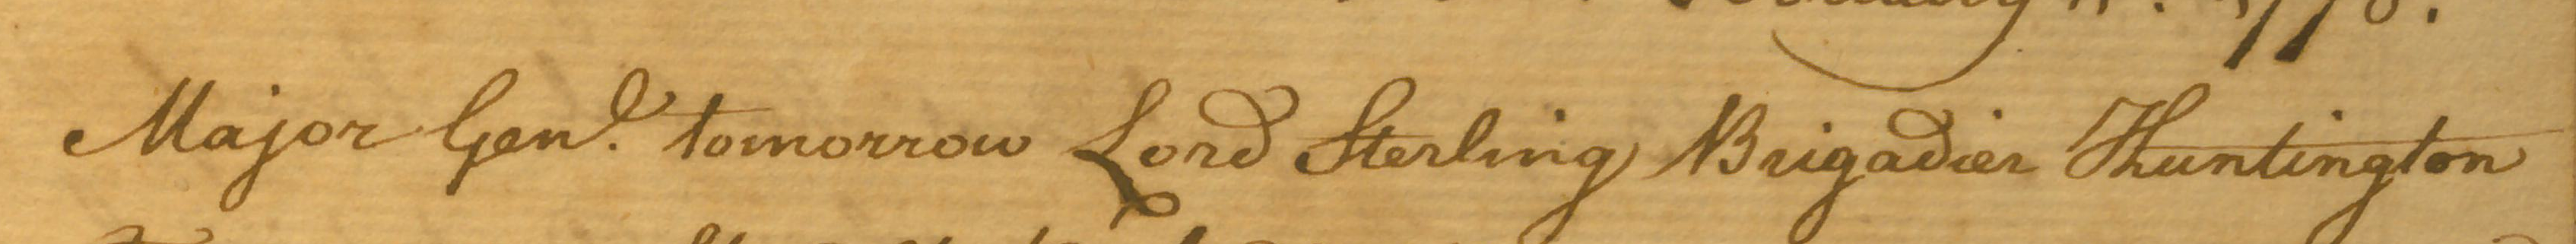Major Gen^l. tomorrow Lord Sterling Brigadier Huntington
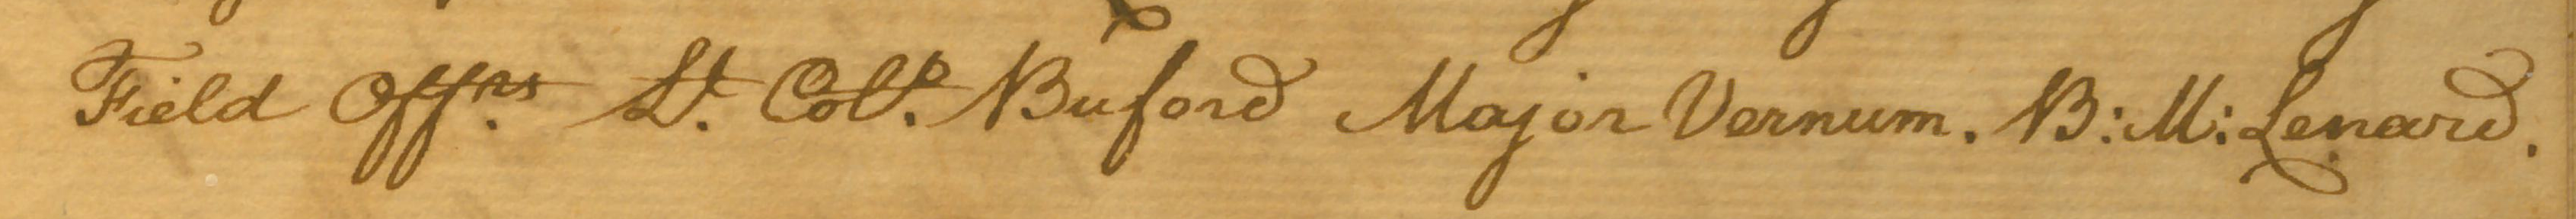Field Off^rs. L^t. Col^o. Buford Major Vernum B: M: Lenard.
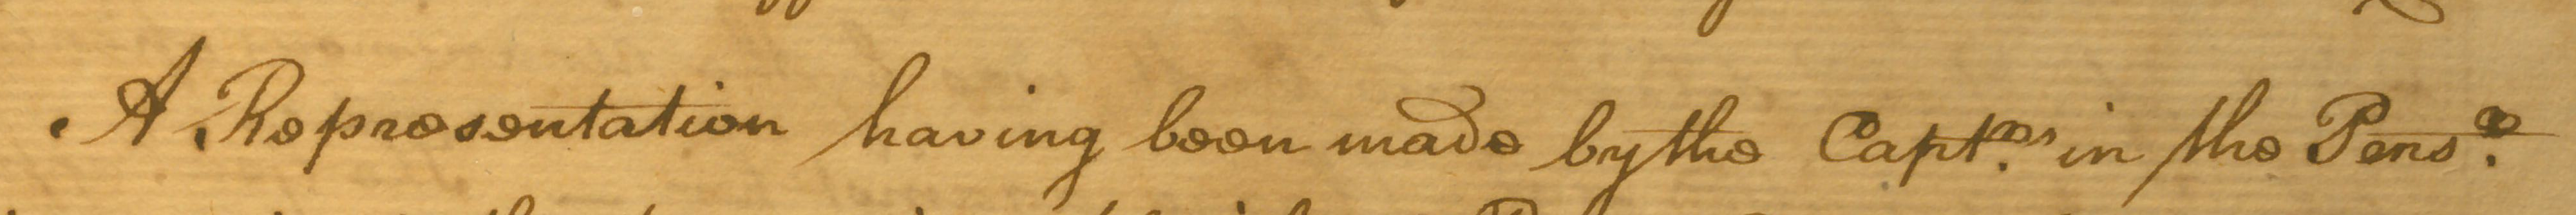A Representation having been made by the Capt^ns. in the Pens^a.
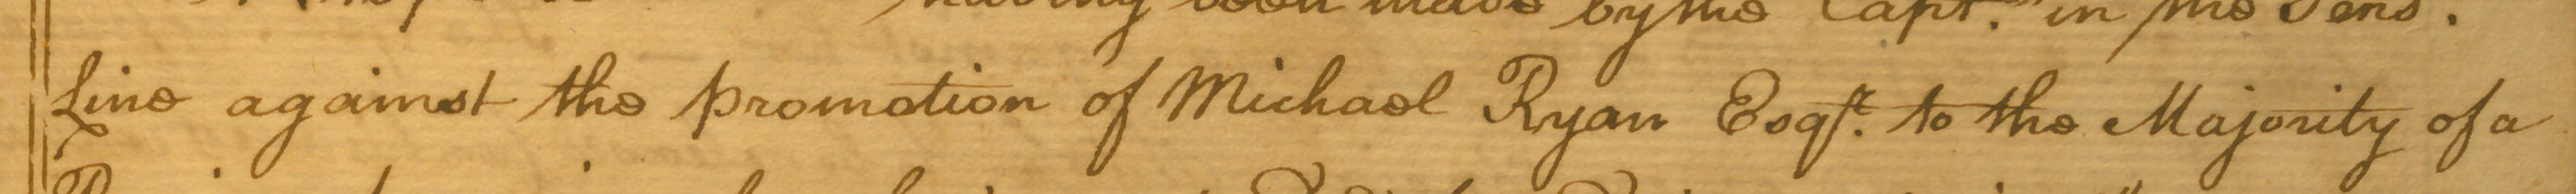Line against the promotion of Michael Ryan Esq^r. to the Majority of a
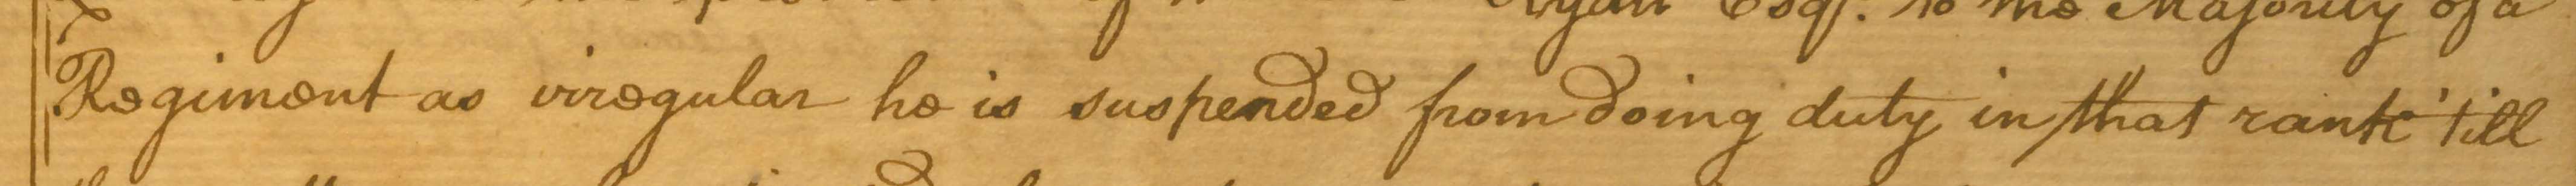Regiment as irregular he is suspended from doing duty in that rank 'till
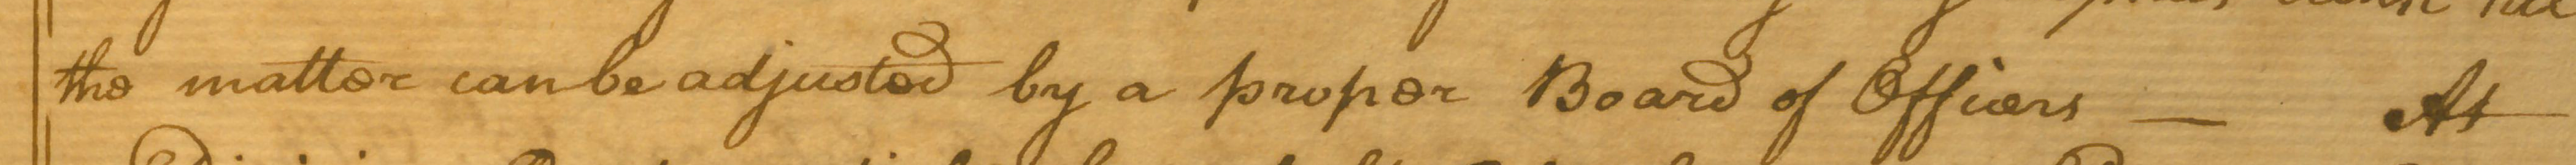the matter can be adjusted by a proper Board of Officers- At
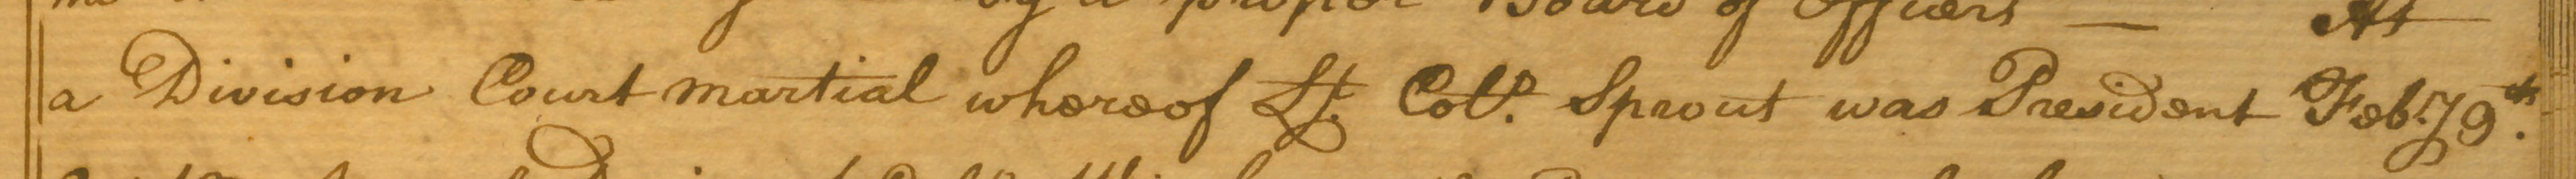a Division Court martial whereof L^t. Col^o. Sprout was President Feb^y. 9^th.
